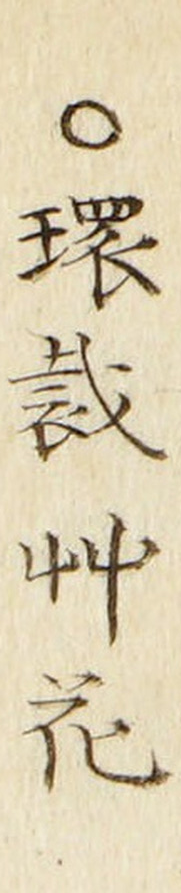○環裁草花
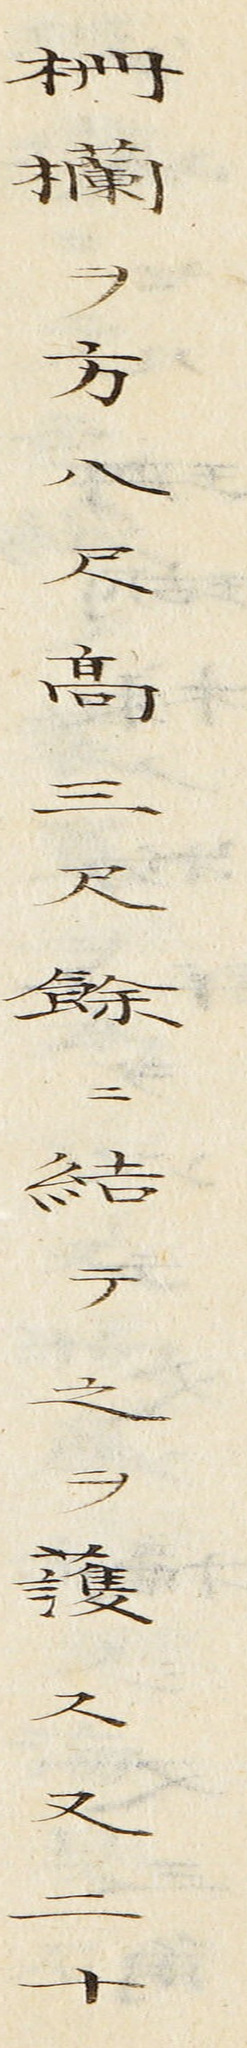柵蘭ヲ方八尺高三尺余ニ結テ之ヲ護ス又二十
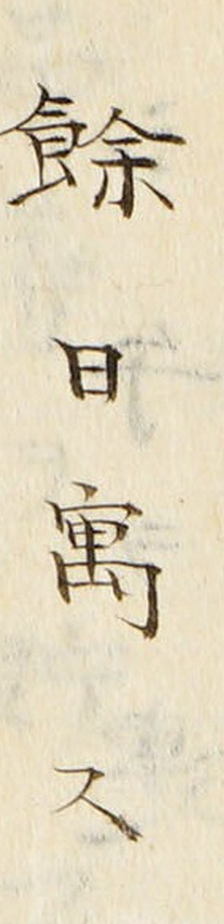余日寓ス
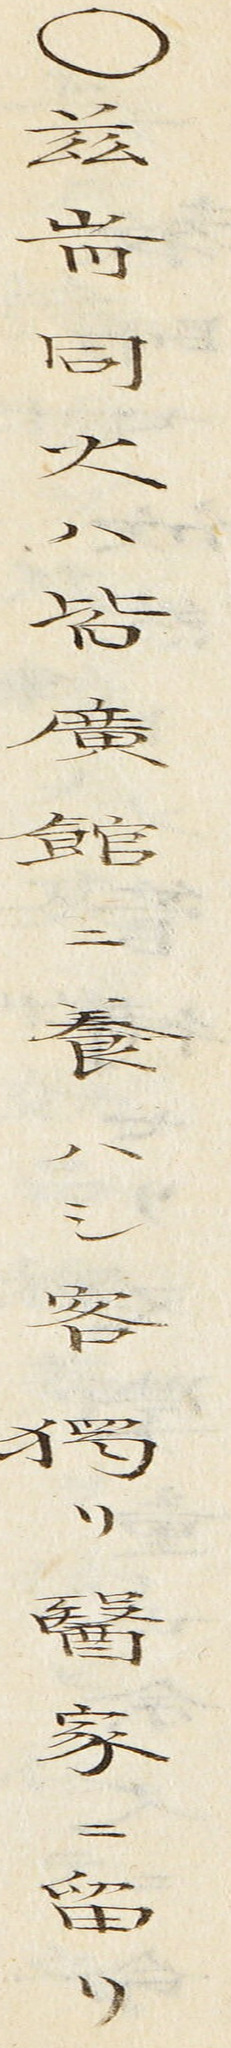○茲時同火ハ皆広館ニ養ハシ客独リ医家ニ留リ
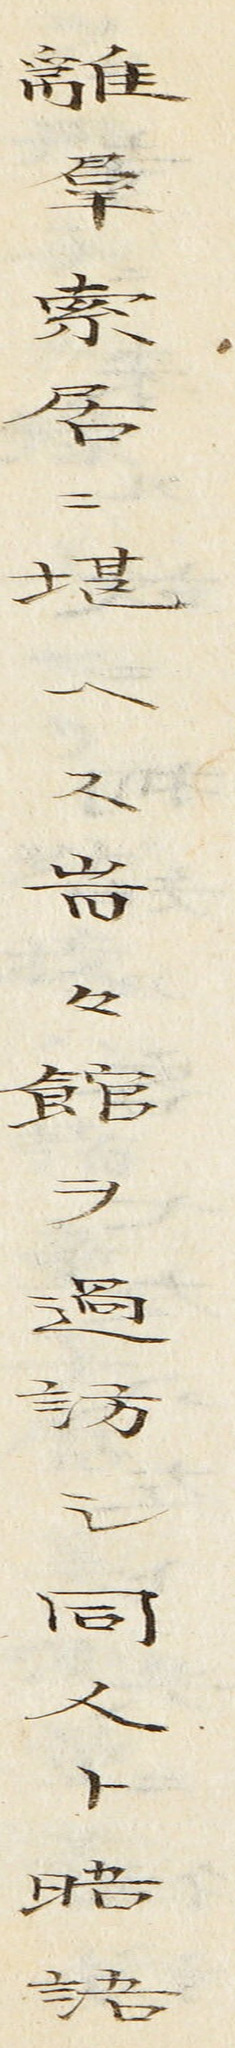離群索居ニ堪へス時々館ヲ過訪シ同人ト晤語
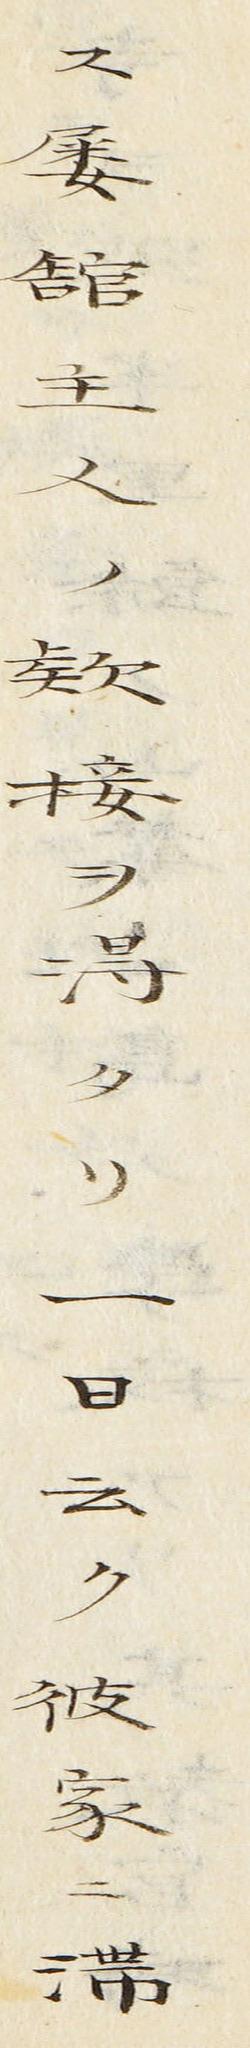ス屡館主人ノ欵接ヲ得タリ一日云ク彼家ニ滞
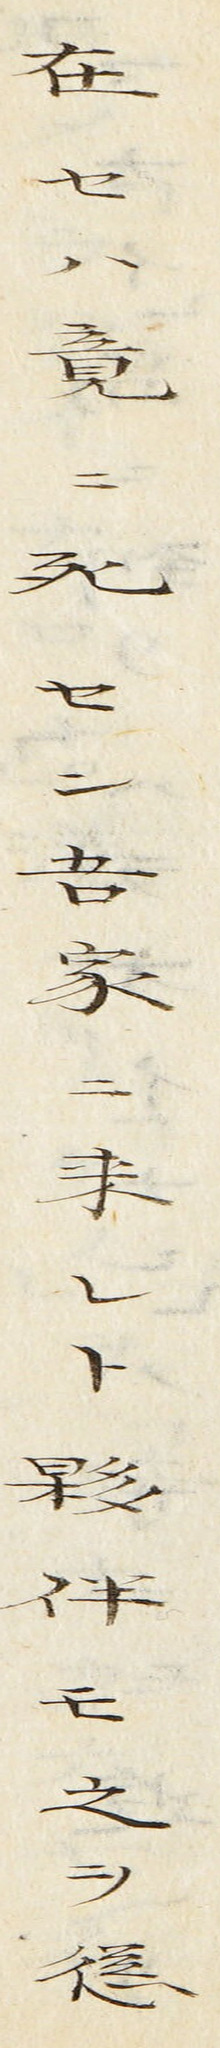在セハ竟ニ死セン吾家ニ来レト夥伴モ之ヲ慫
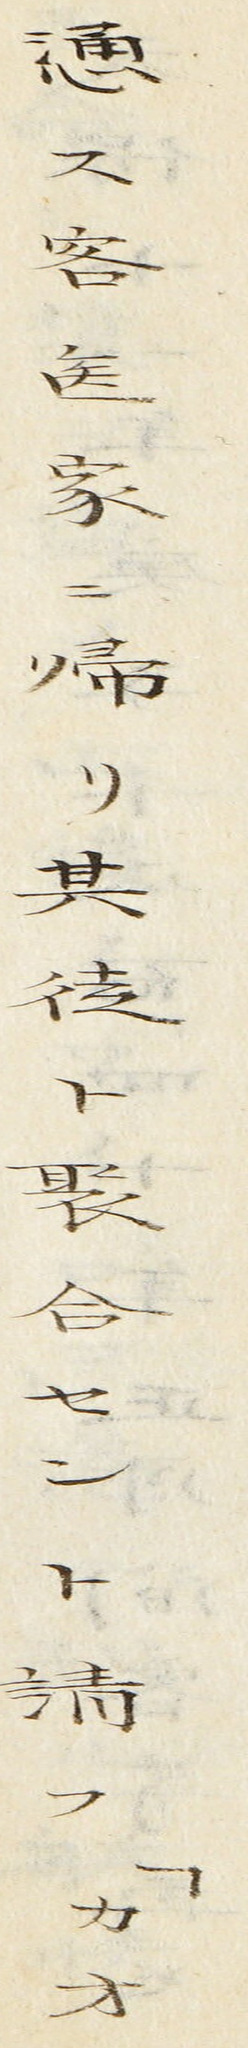慂ス客医家ニ帰リ其徒ト聚合セント請フ「カオ
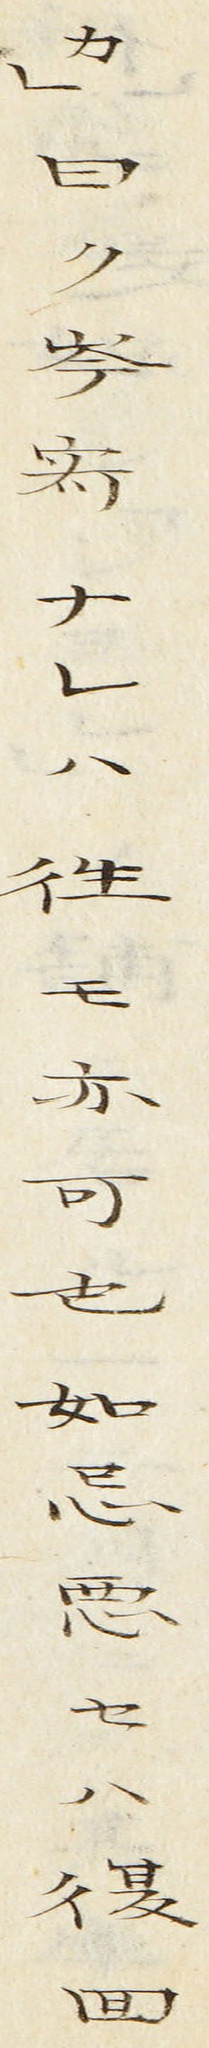カ」曰ク岑ナレハ徃モ亦可也如忌悪セハ復回
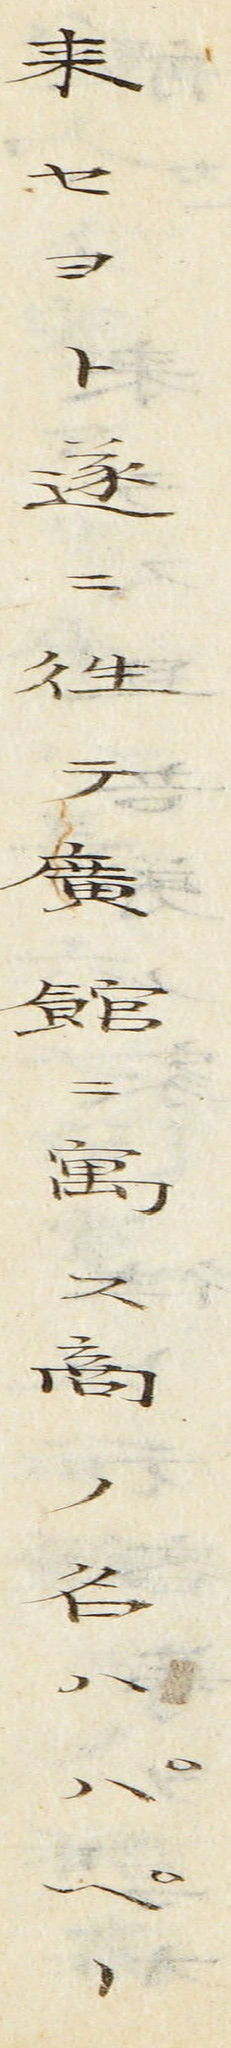来セヨト遂ニ往テ広館ニ寓ス商ノ名ハパペー
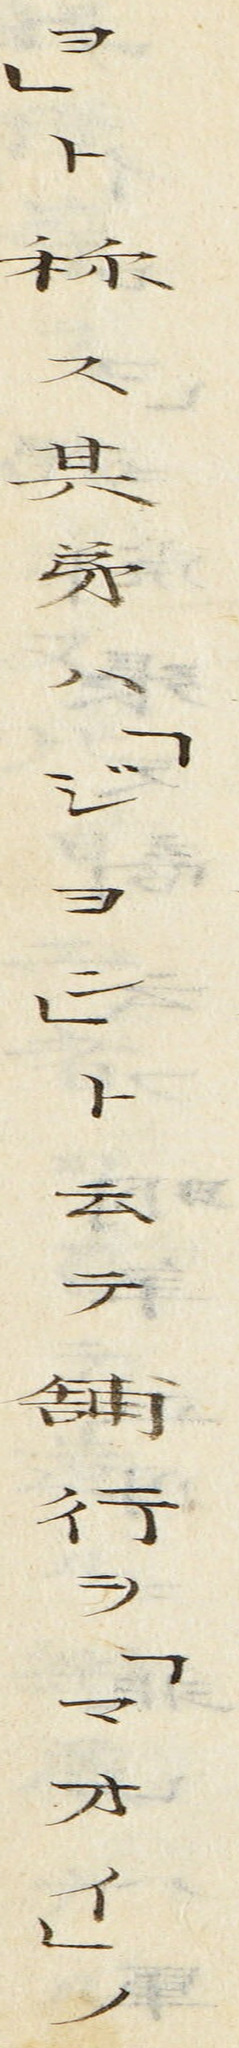ヨ」ト称ス其弟ハ「ジヨン」ト云テ舗行ヲ「マオイ」ノ

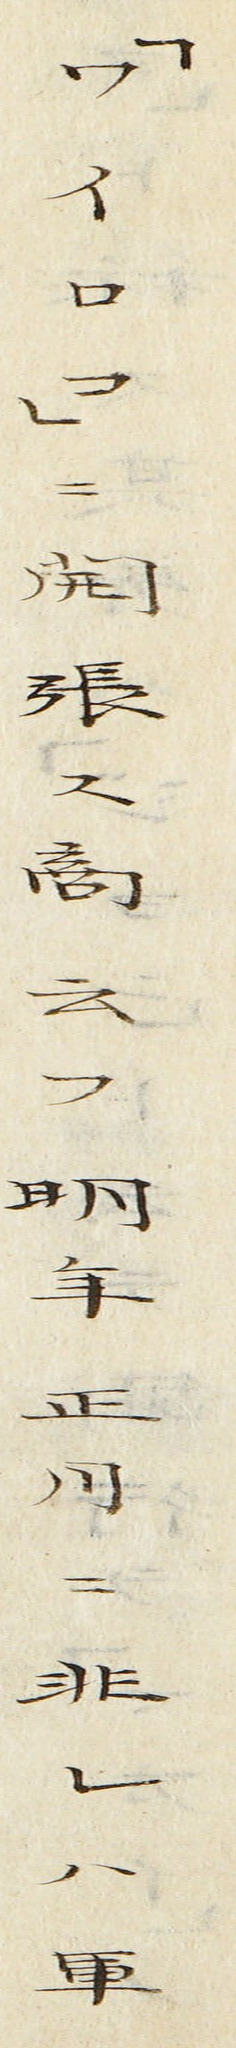「ワイロコ」ニ開張ス商云フ明年正月ニ非レハ軍
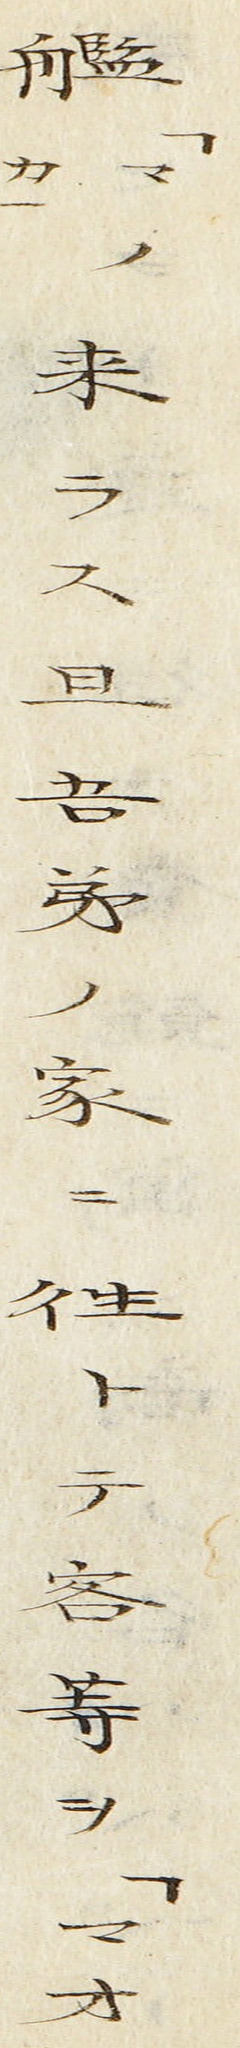艦「マノカ」来ラス旦吾弟ノ家ニ往トテ客等ヲ「マオ
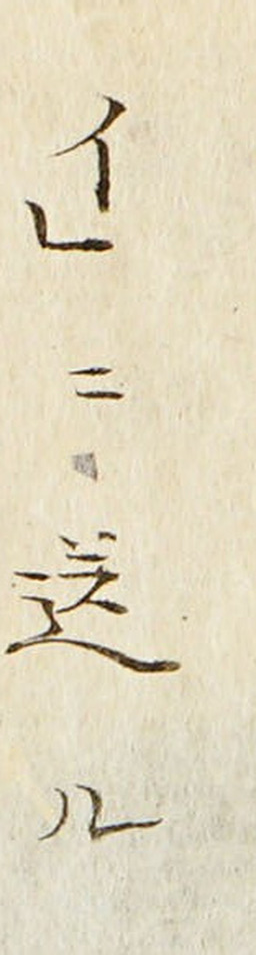イ」ニ送ル
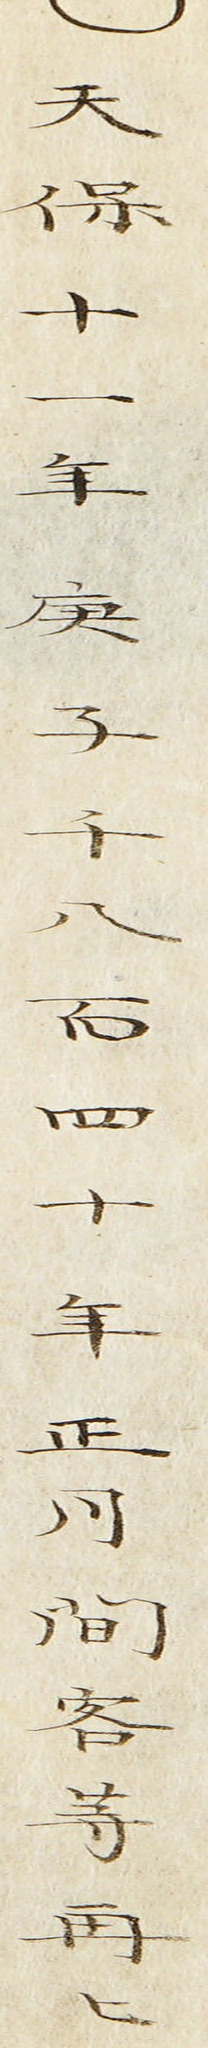○天保十一年庚子千八百四十年正月間客等再ヒ
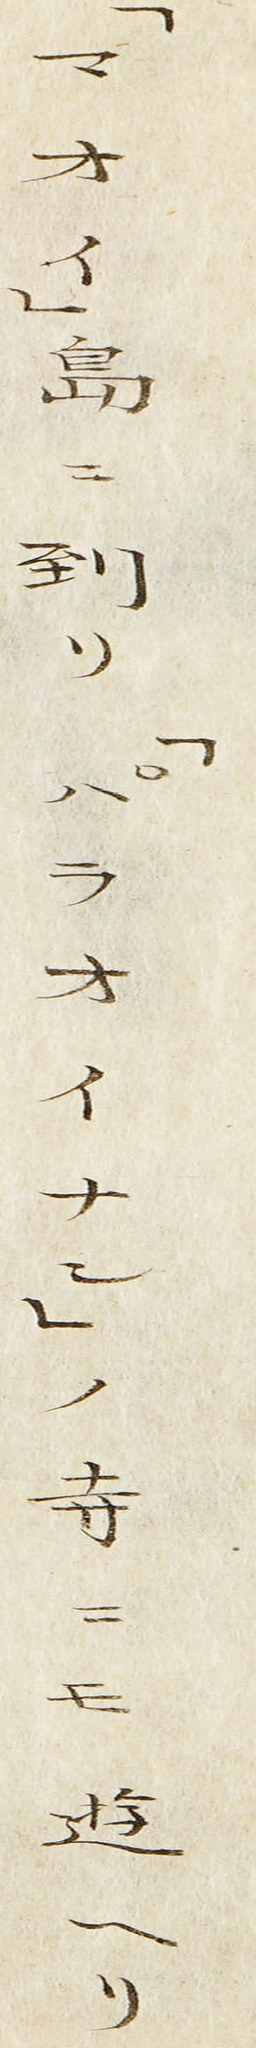「マオイ」島ニ到リ「パラオイナン」ノ寺ニモ遊ヘリ
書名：蕃談
